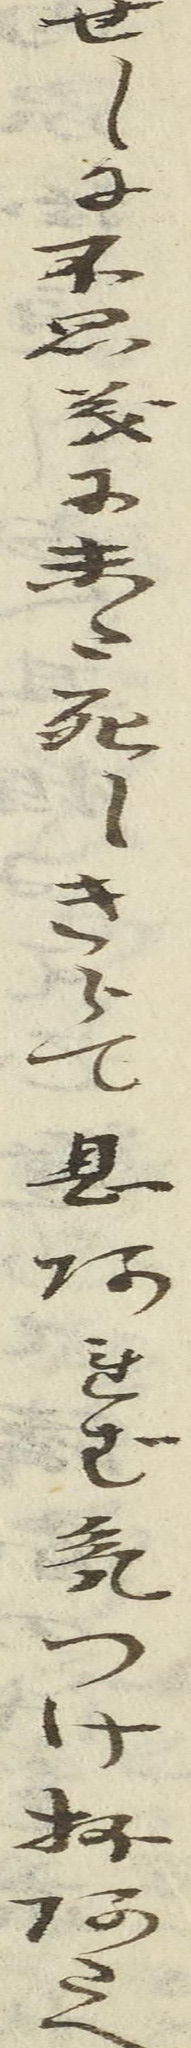せしに不思議に未た死しきらて息あらば気つけ抔あたへ
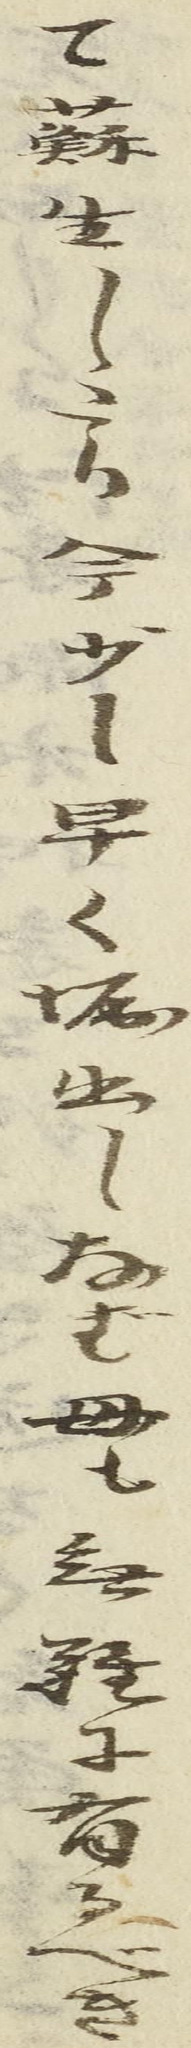て蘇生したり今少し早く掘出しなば母も無難に有るべき
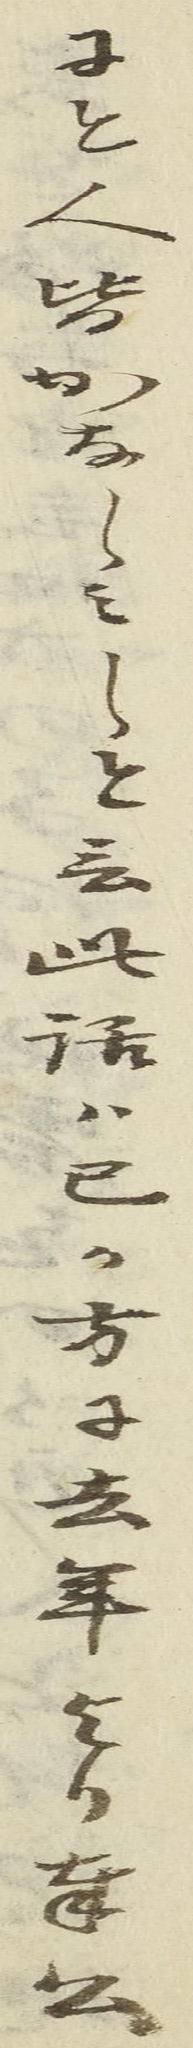にと人皆かなしミしと云此話ハ己方に去年より奉公
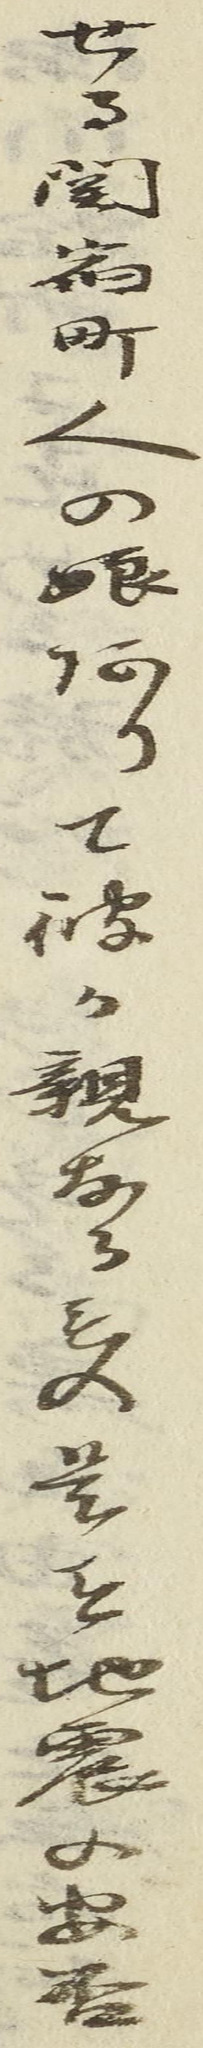せる関宿町人の娘ありて彼か親なるもの是を地震の安否
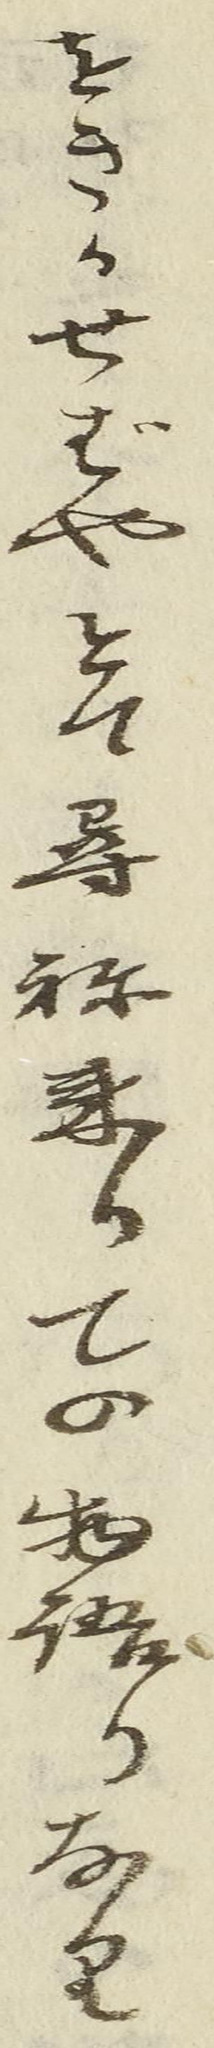をきかせばやとて尋ね来りての物語りなり
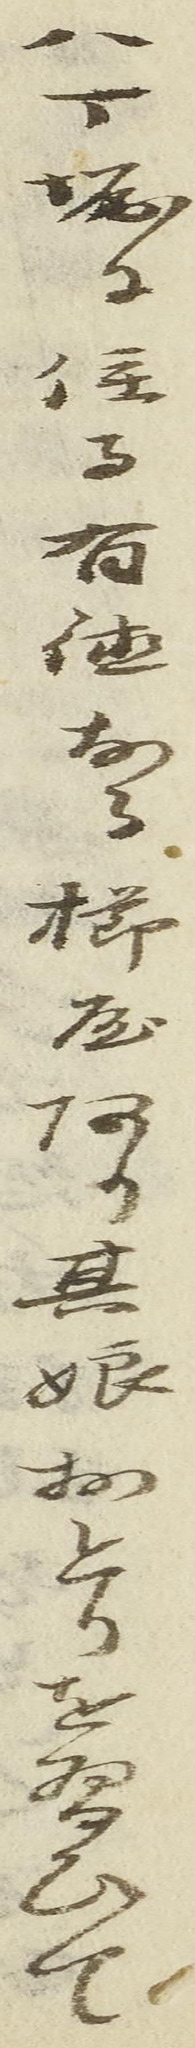八丁堀に住る有徳なる櫛屋あり其娘おとりを習ひて
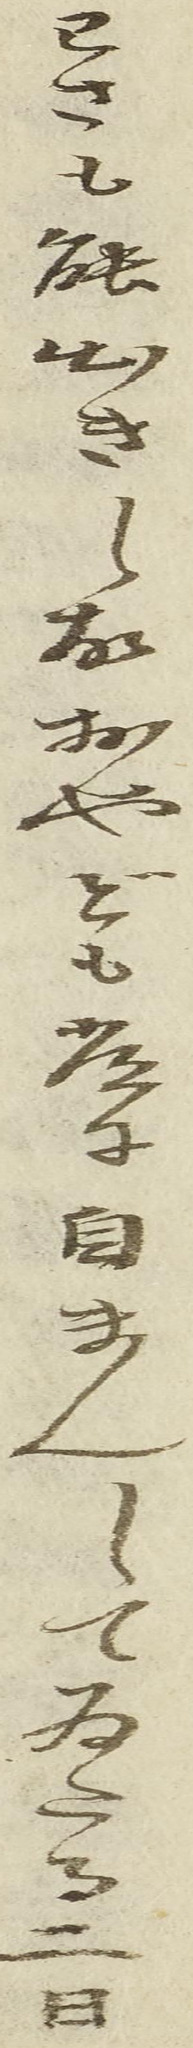わさも能出きし故おやども常に自まんしてゐたる二日

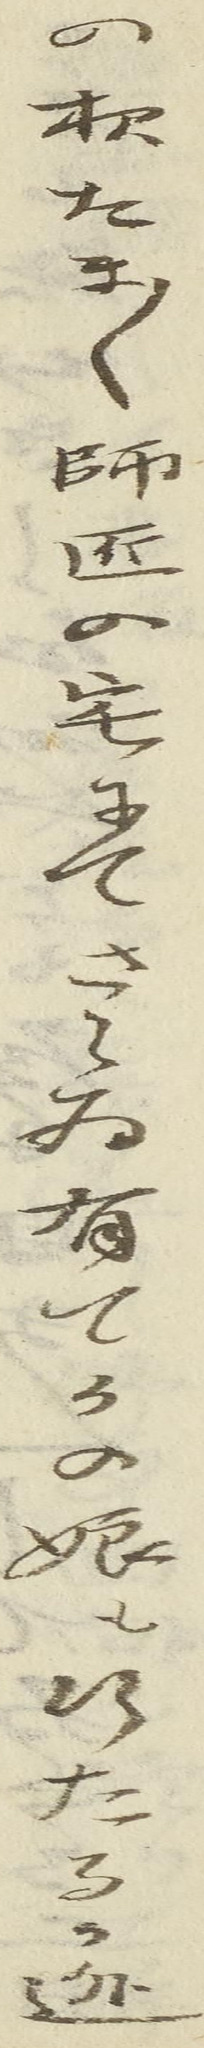の夜たま〳〵師匠の宅にてさらゐ有てかの娘も行たるか逃
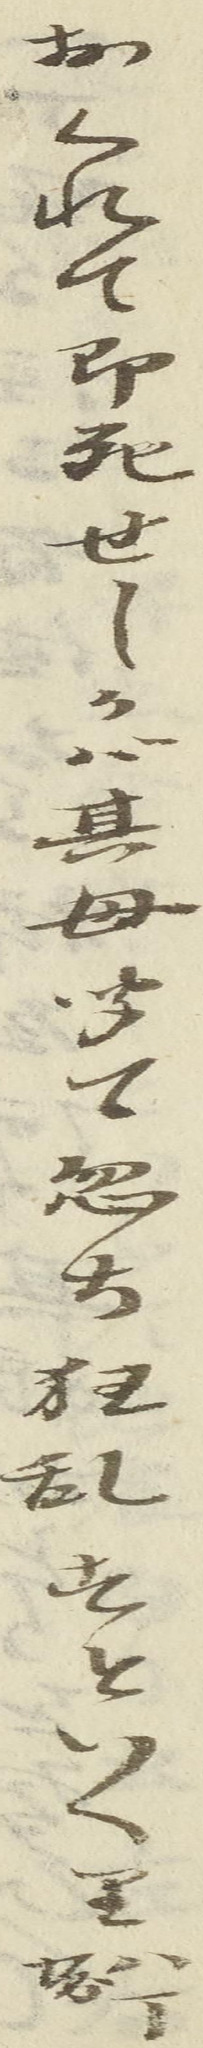おくれて即死せしかば其母聞て忽ち狂乱すといへり八丁堀
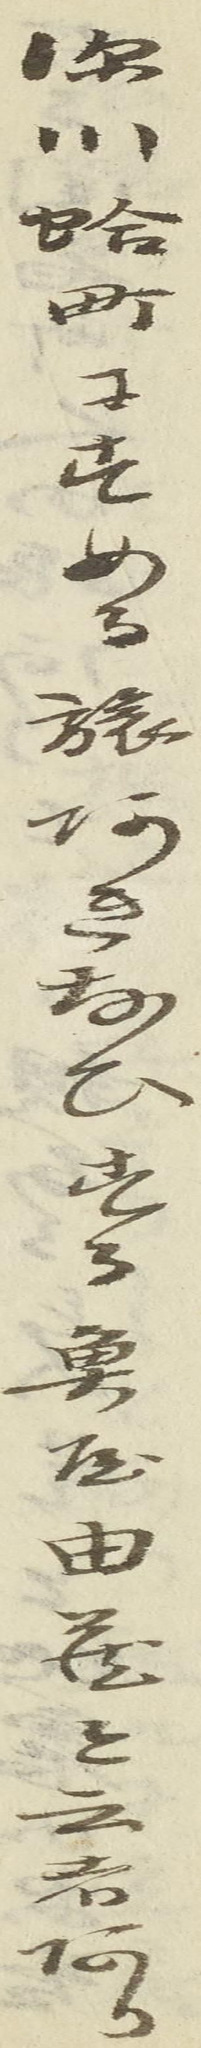深川蛤町にすめる旅あきなひする魚屋由蔵と云者あり
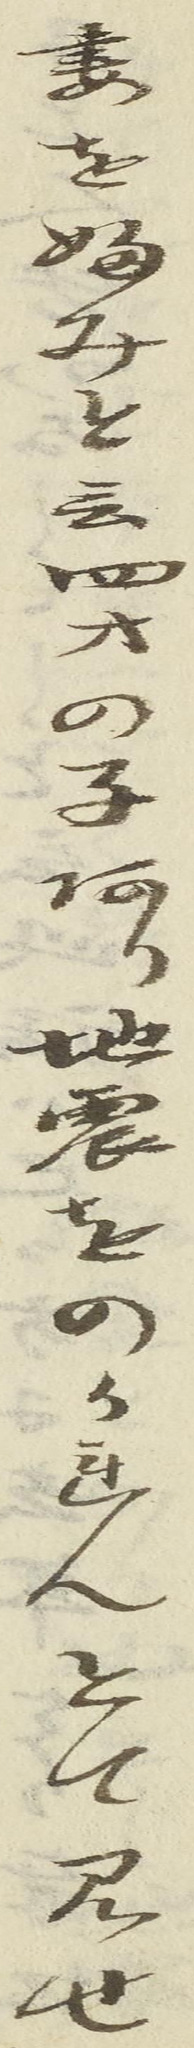妻を婦みと云四才の子あり地震をのかれんとて見せ
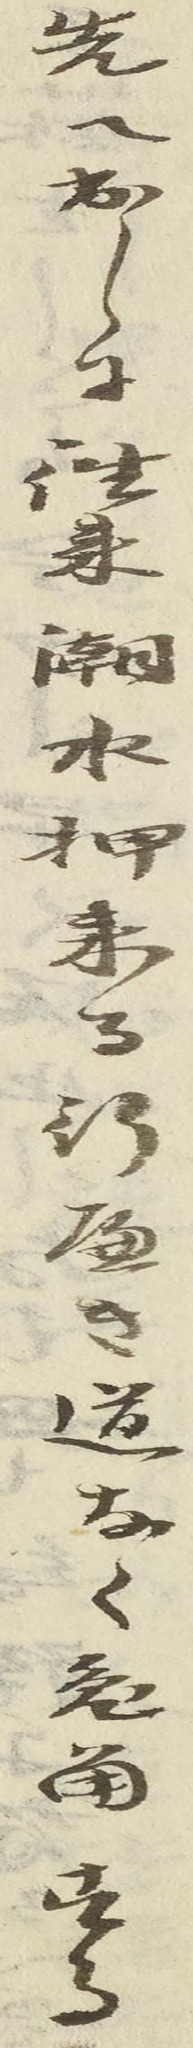先へ出しに往来湖水押来る行へき道なく兎角する
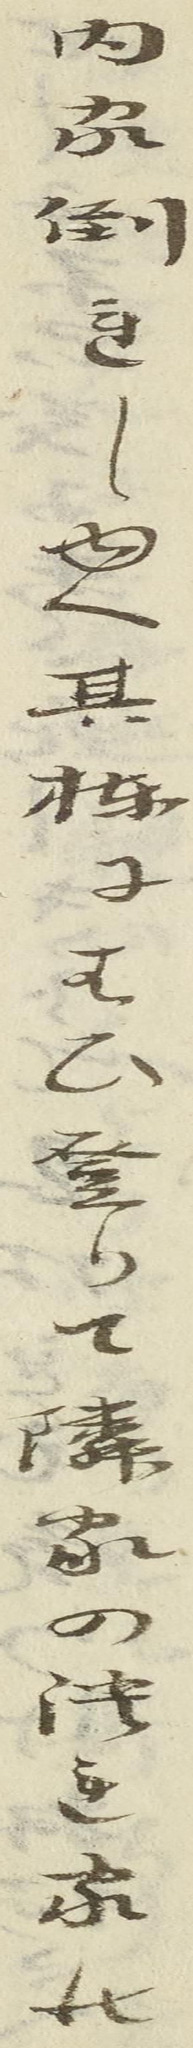内家倒れしゆへ其棟にはひ登りて隣家の潰れ家の
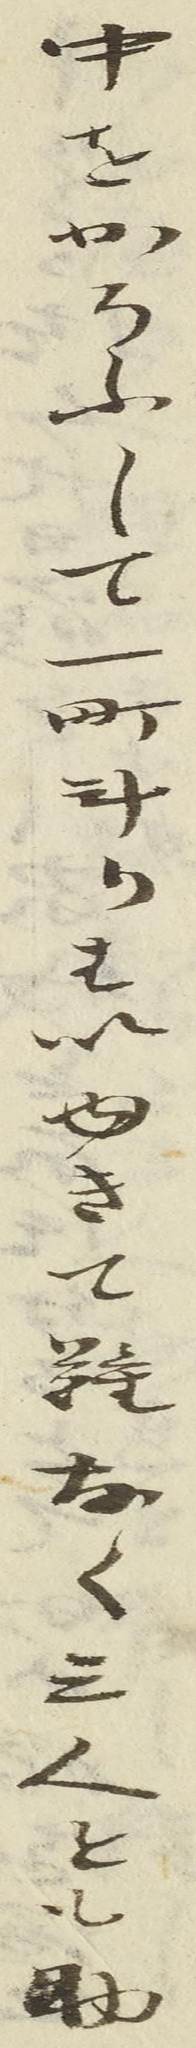中をかろうして一町斗りはいゆきて難なく三人とも助
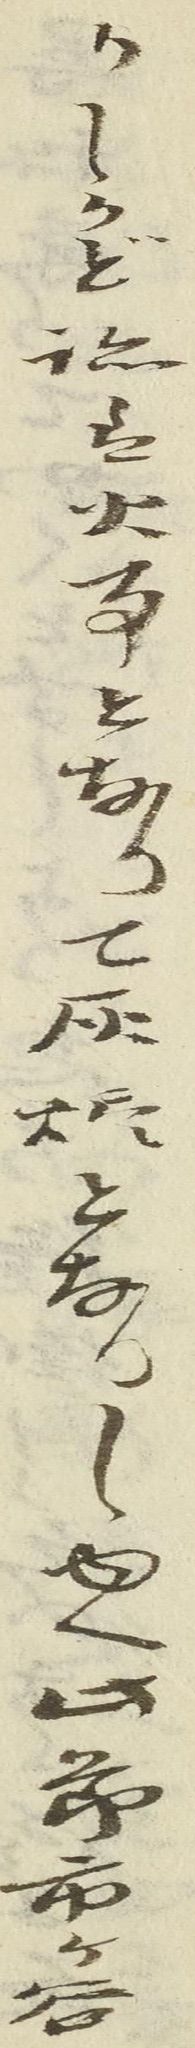りしかど跡は火事となりて灰燼となりしゆへ此節市ヶ谷
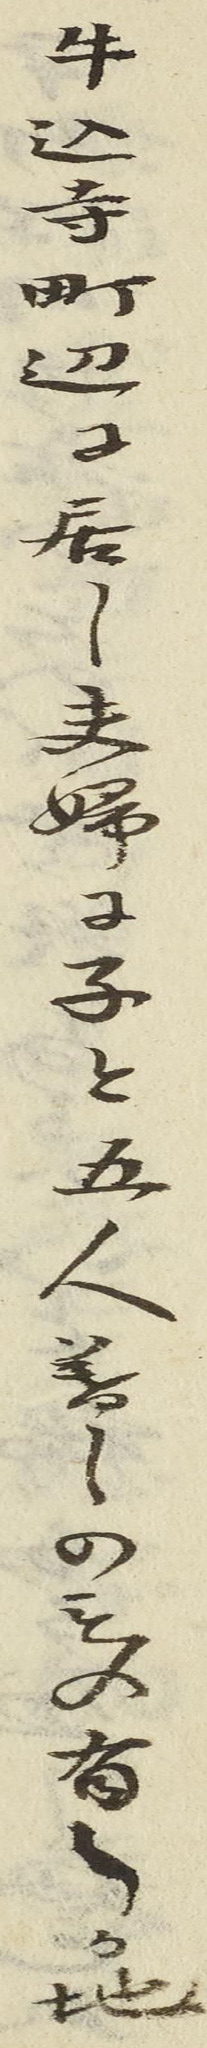牛込寺町辺に居し夫婦に子と五人暮しのもの有しか地
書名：那為の後見艸　全
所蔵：東京大学地震研究所図書室 Earthquake Research Institute Library, The University of Tokyo, JAPAN
